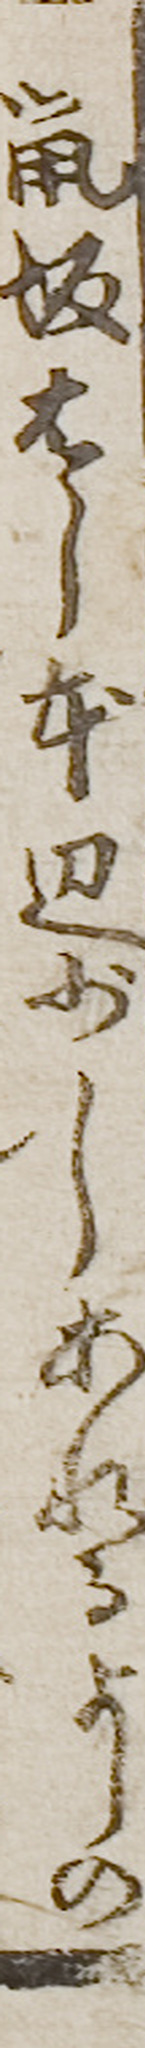鼠坂はし本辺少しあれるよしの
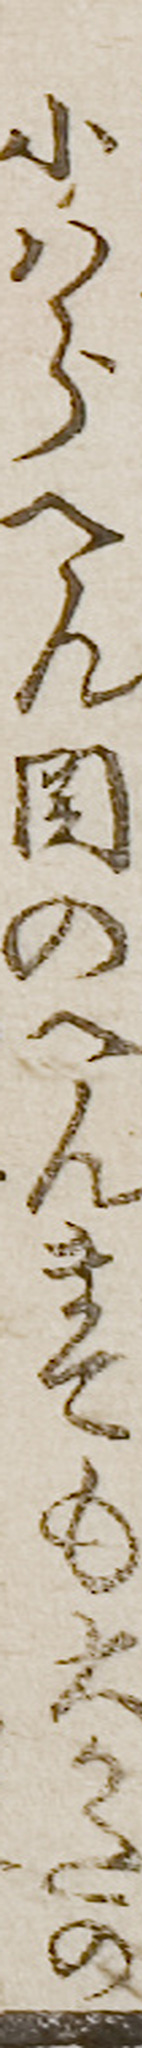小はらへん関のへんまても大かたの
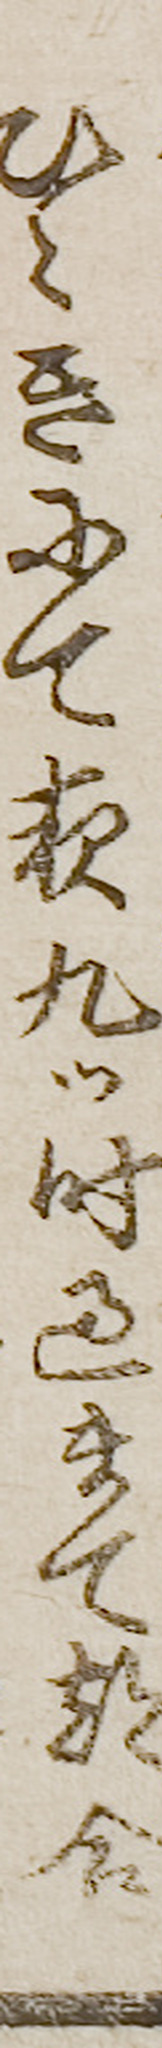ひひきにて夜九ツ時過まて都合
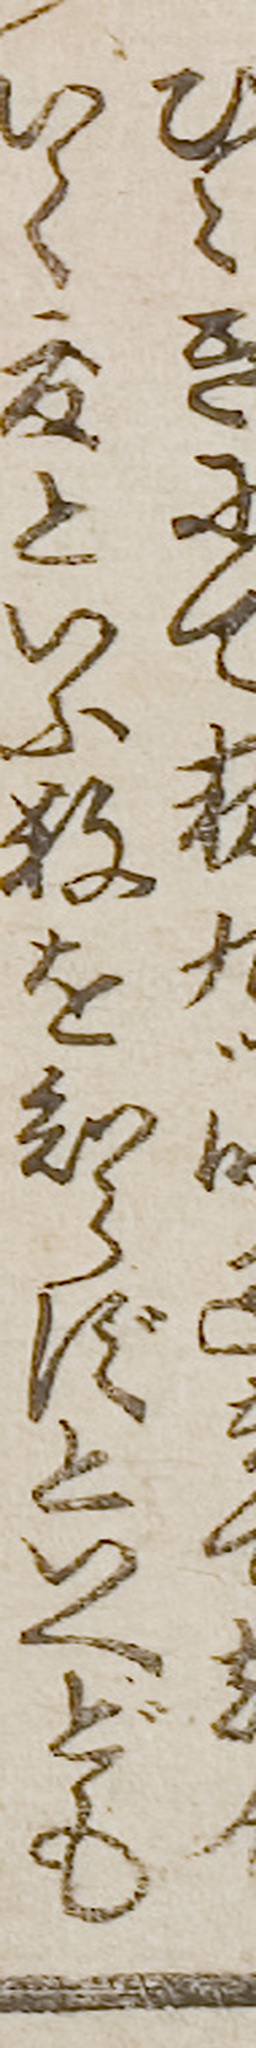いく度といふ数を知らずといへども
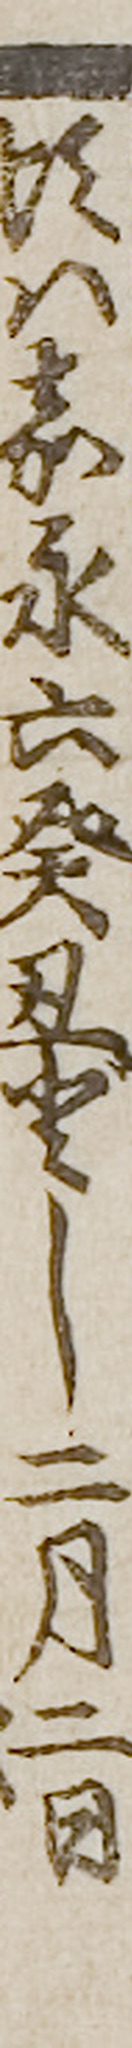頃ハ嘉永六癸丑どし二月二日
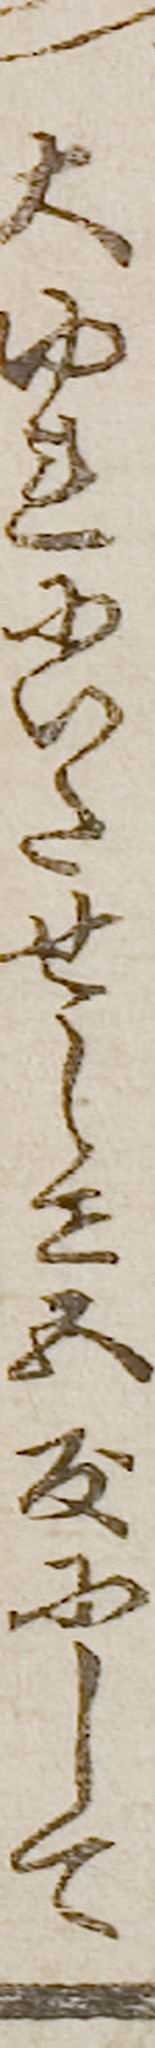大ゆれにいたせしを五度にして
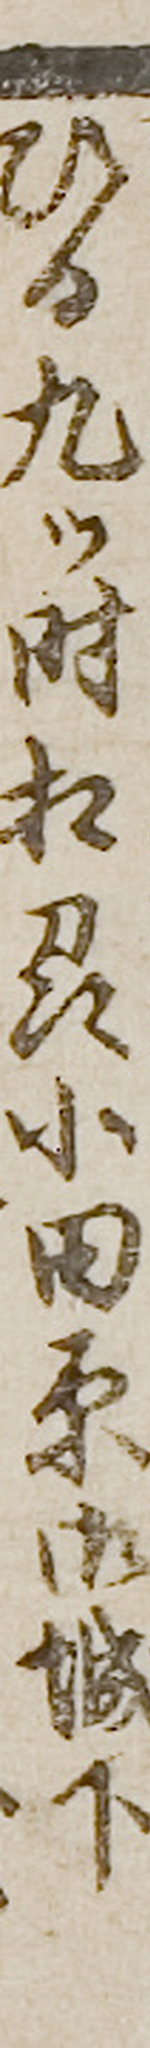ひる九ッ時相州小田原御城下
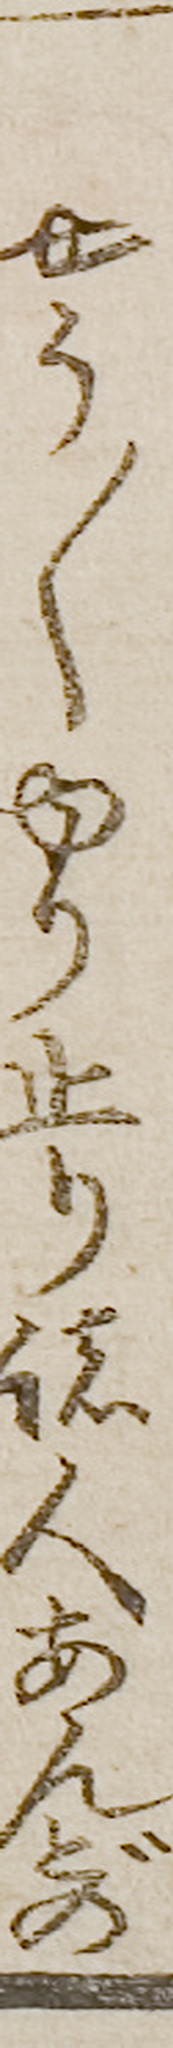せう々ゆり止り諸人あんどの
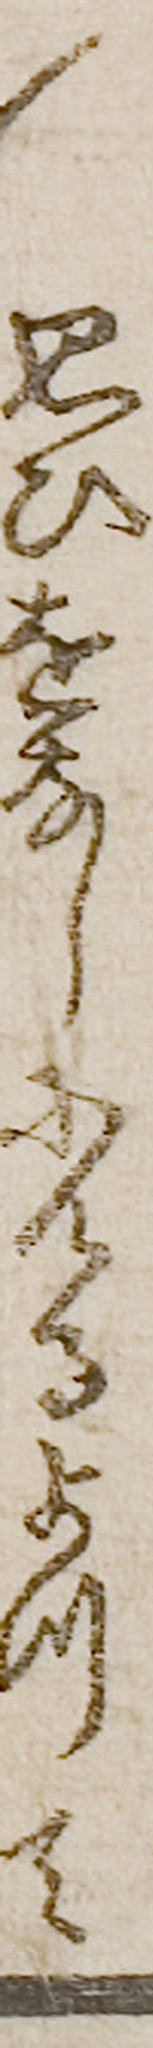思ひをなしにけるよつて
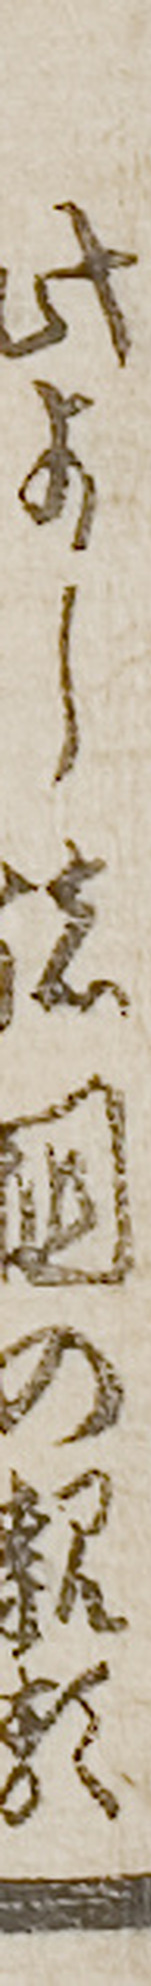此よし諸国の親類
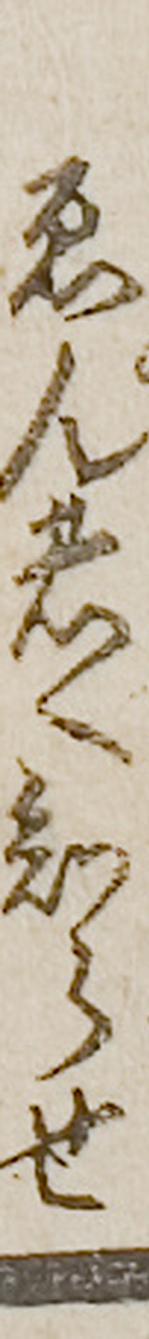ゑん者へ知らせ
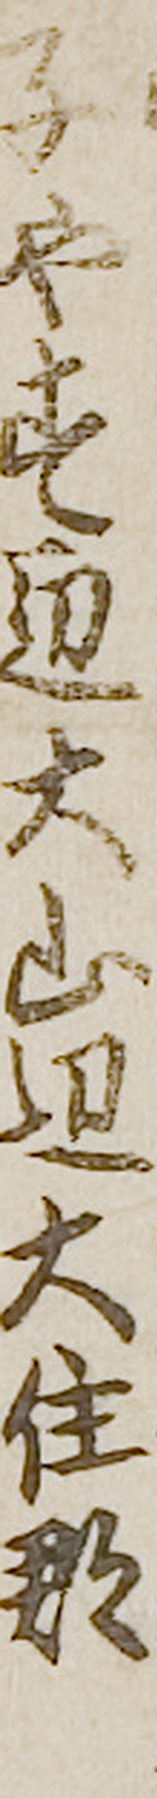子やす辺大山辺大住郡
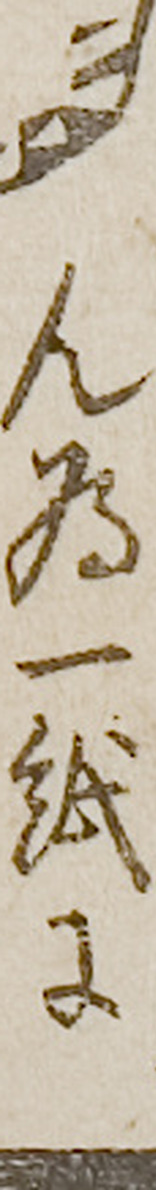ん為一紙に
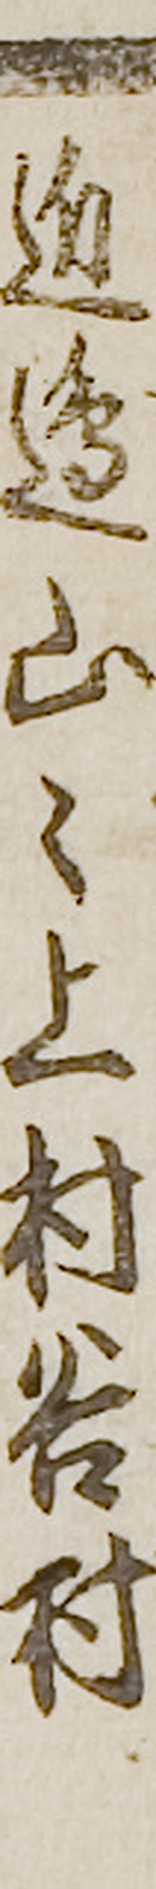近辺山々上村谷村
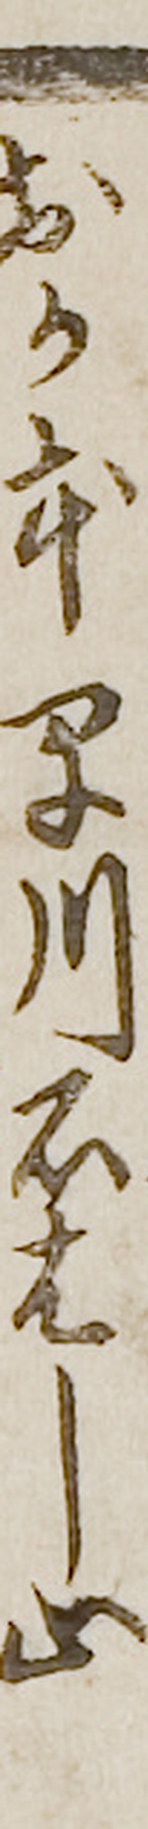おか本早川石はし山
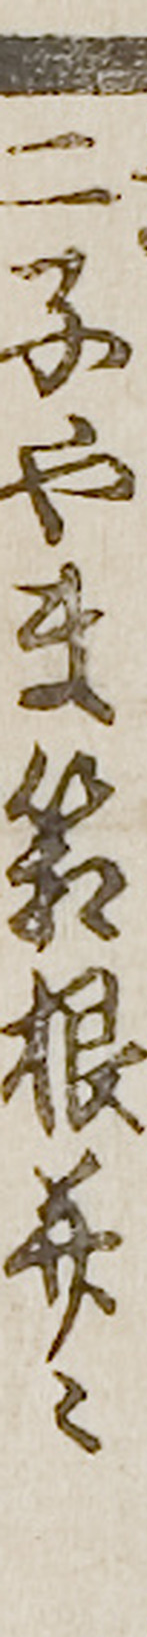二子やま箱根并に
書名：相模国大地震
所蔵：東京大学総合図書館 General Library in the University of Tokyo, JAPAN
